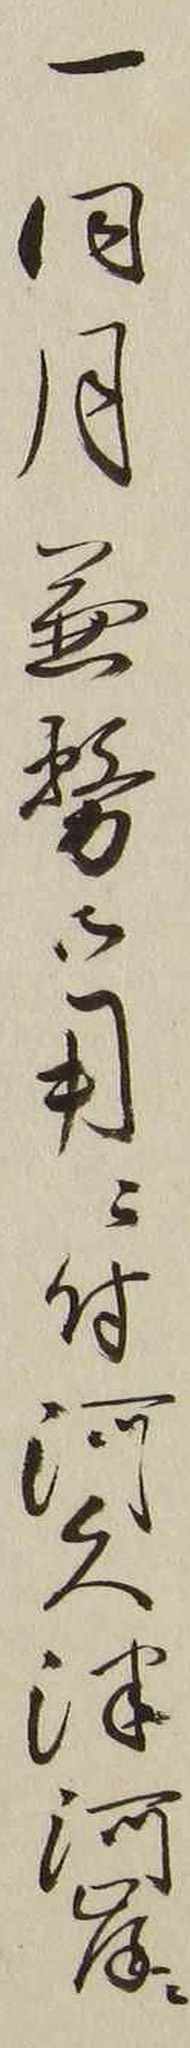一同月兼務御用ニ付阿久津河岸ニ
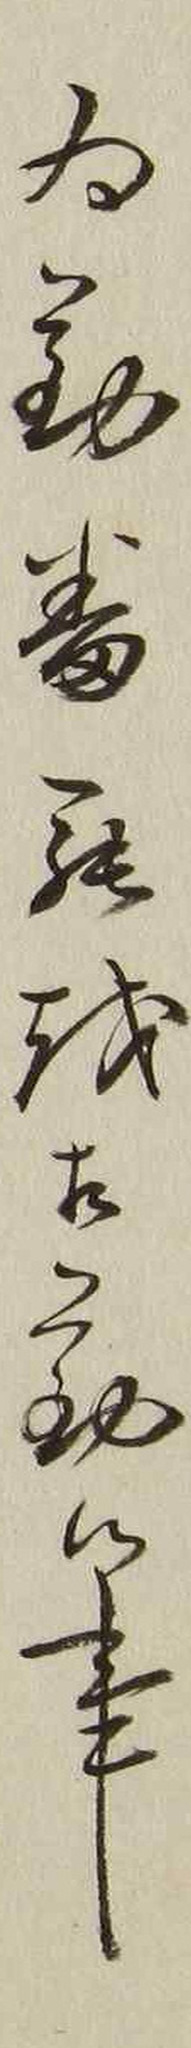為勤番罷越相勤候事
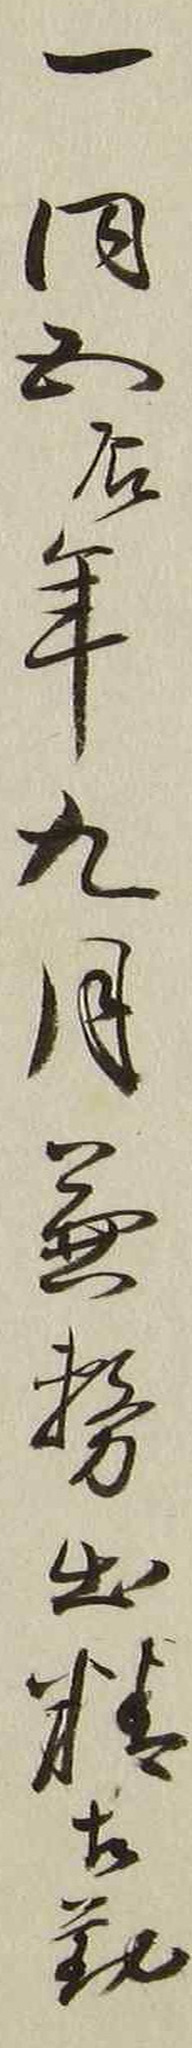一同五辰年九月兼務出精相勤
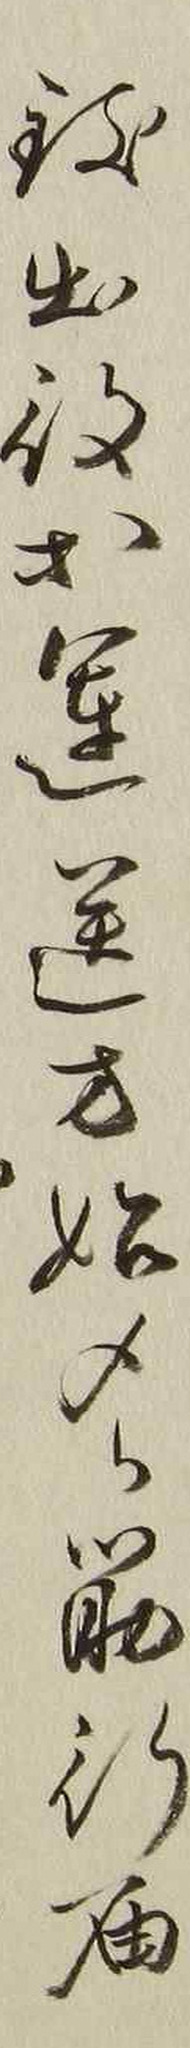致出役等運送方始〆り筋行届
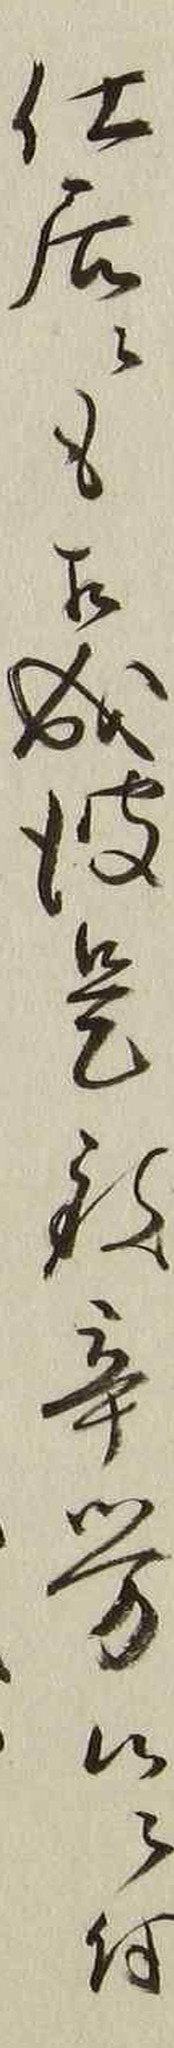仕居ニも相成彼是致辛労候ニ付
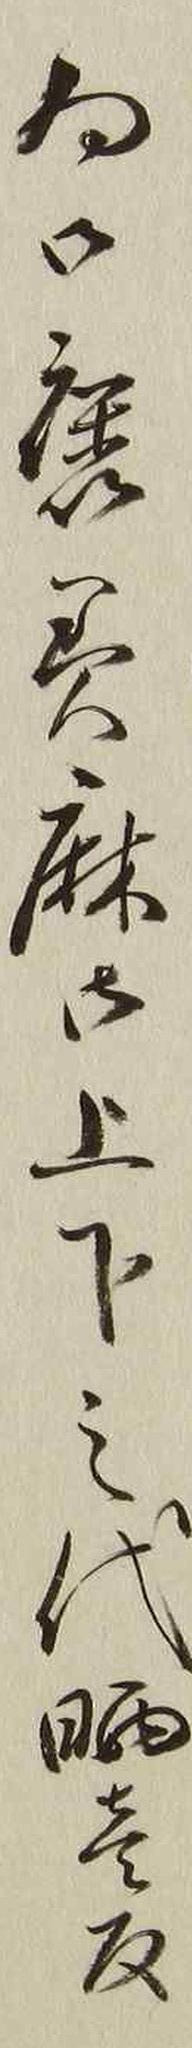為御褒美麻御上下之代晒壱反
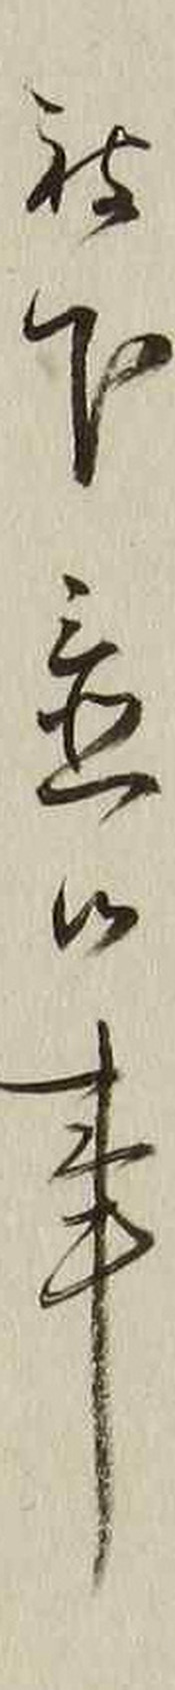被下置候事
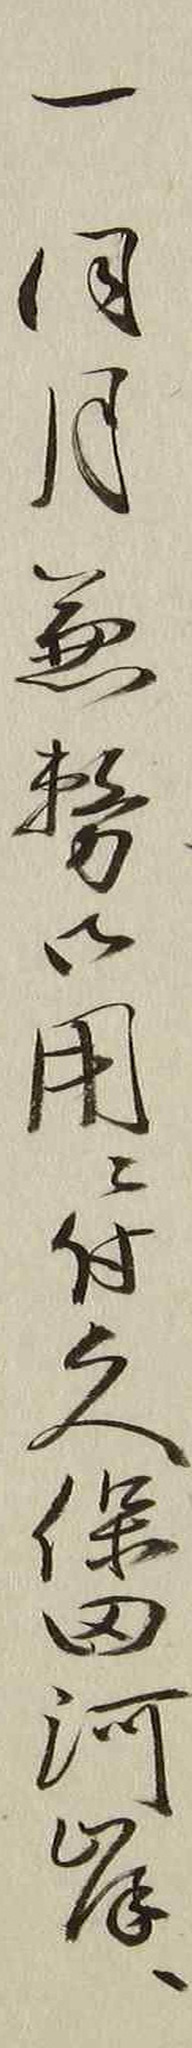一同月兼務御用ニ付久保田河岸ヘ
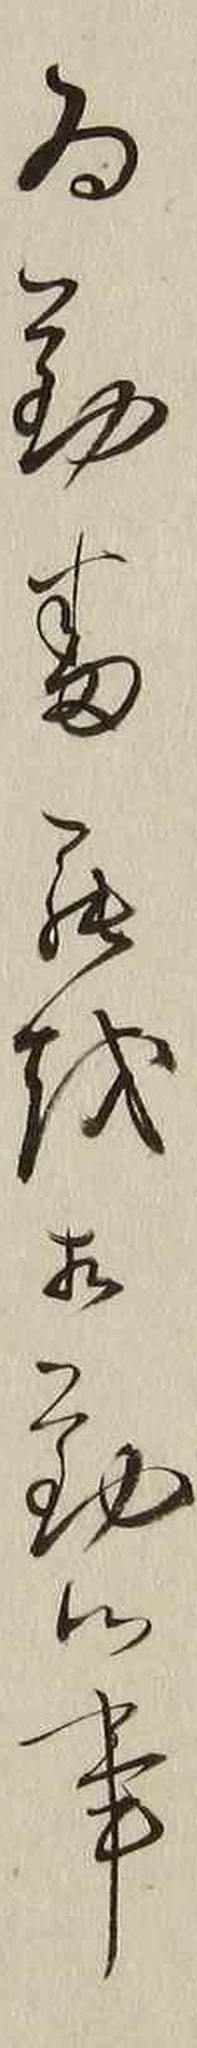為勤番罷越相勤候事
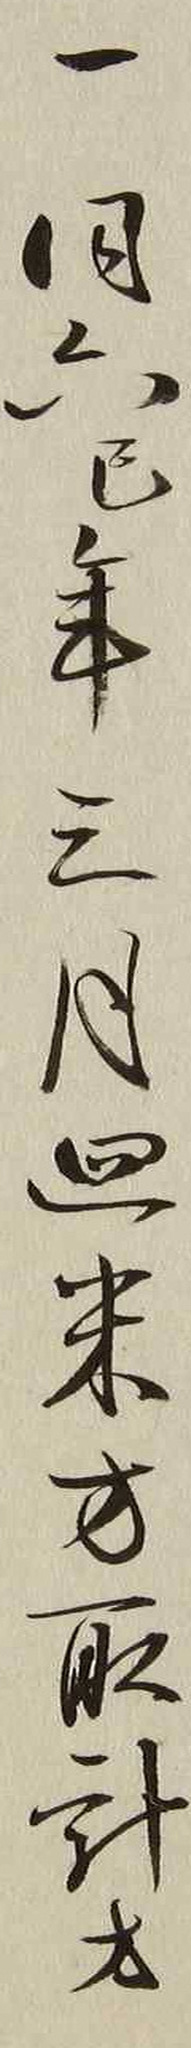一同六巳年三月廻米方取計方
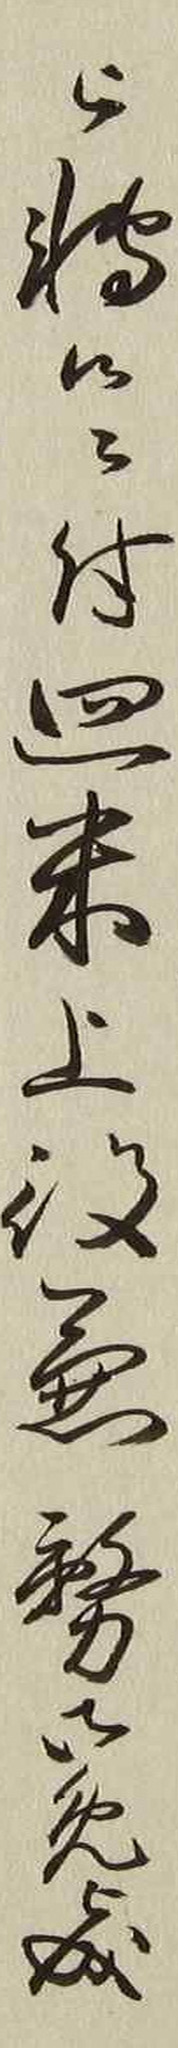被転候ニ付廻米上役兼務御免被成
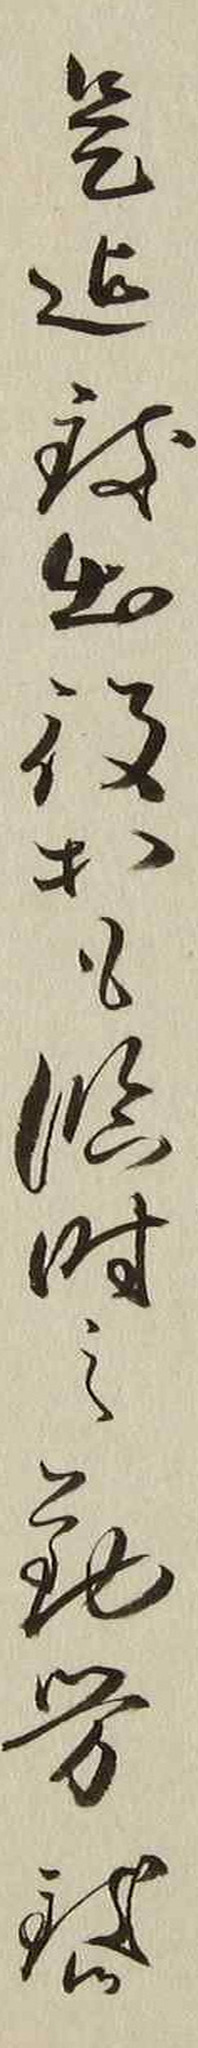是迄致出役等も臨時之勤労致候
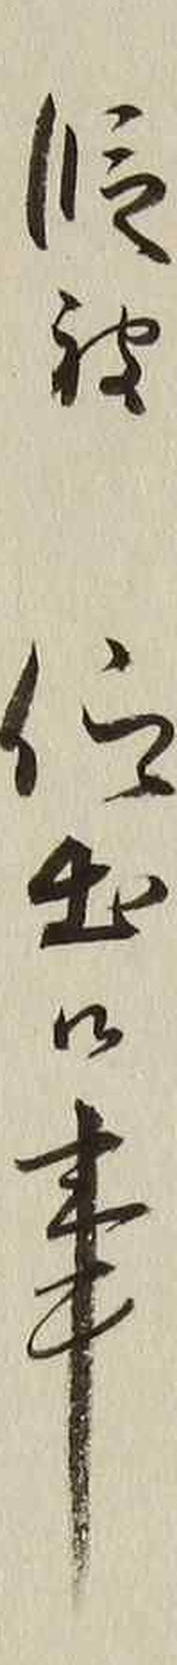段被仰出候事
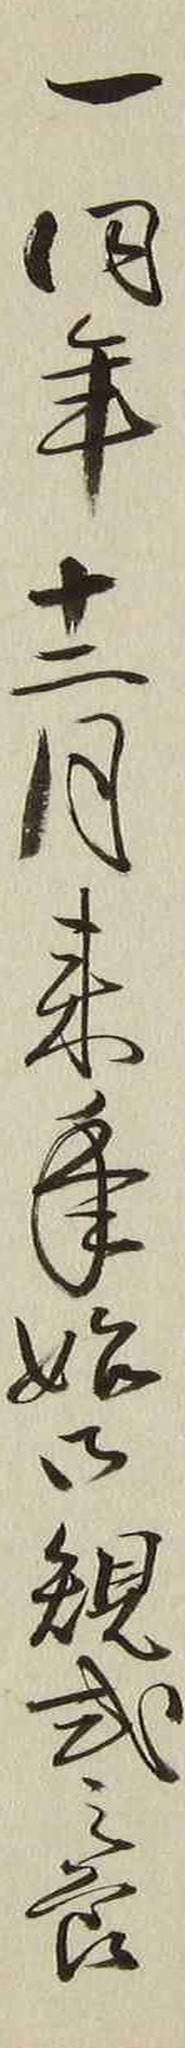一同年十二月来年始御観式之節
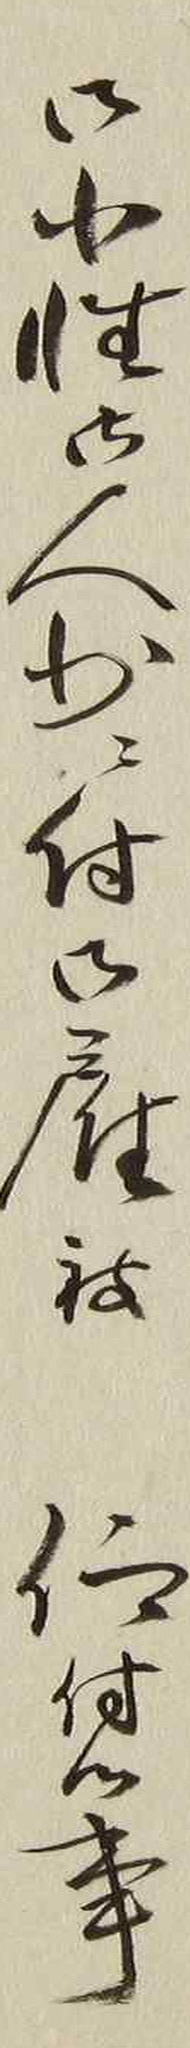御小性御人少ニ付御雇被仰付候事
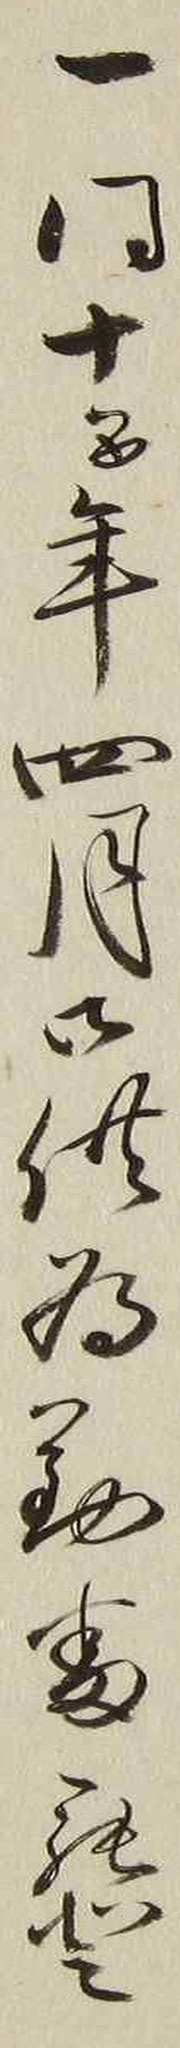一同十酉年四月御供為勤番罷登
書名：諸士系譜　巻之163　な之部5
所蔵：会津若松市立会津図書館
